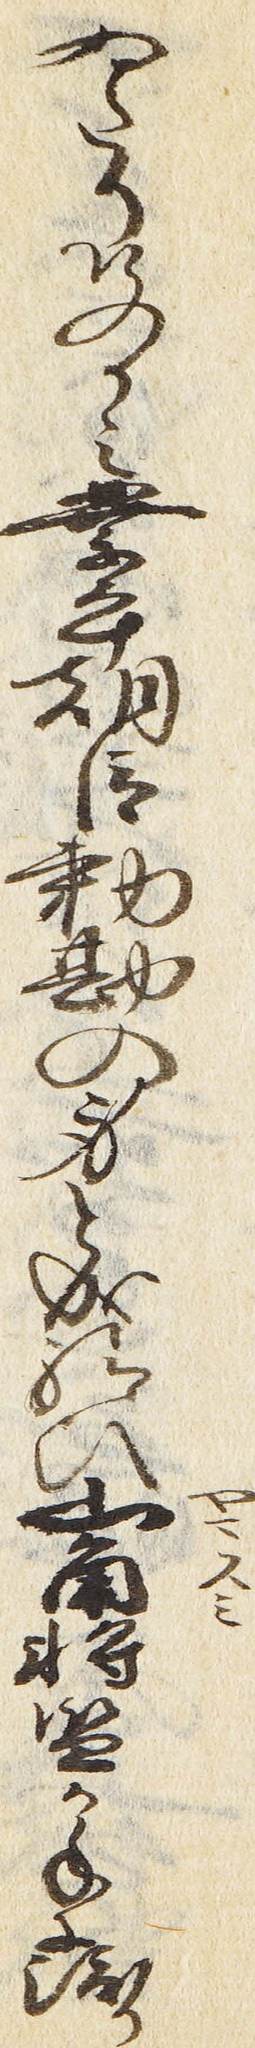ゐたりそのかみ業平朝臣勅勘の身と成給ひ山角将監か手に渡り
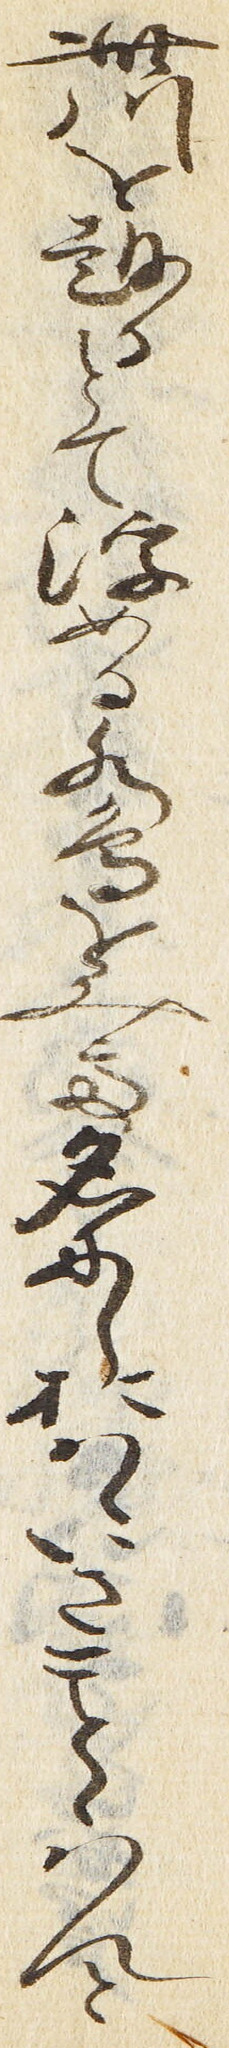此川を越るとて浮める水鳥をみて名にしおはゝいさことゝはんと
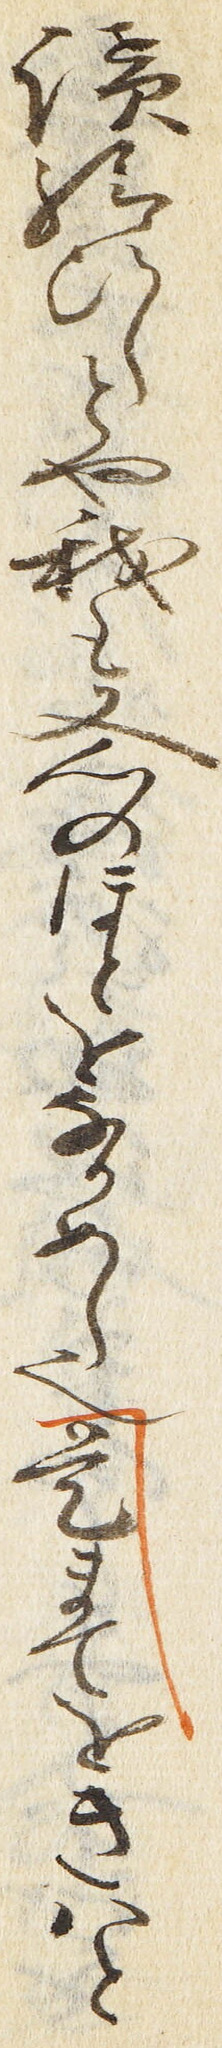読給ひしとや我も又心のほとをなかめし也「是まてをきはと
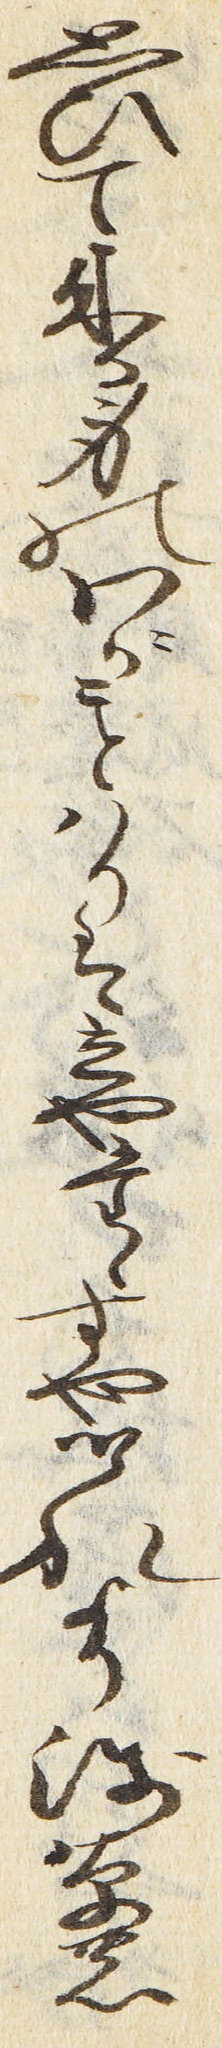思ひて来る身のわがことはりは立やたゝすやそれより浅草の
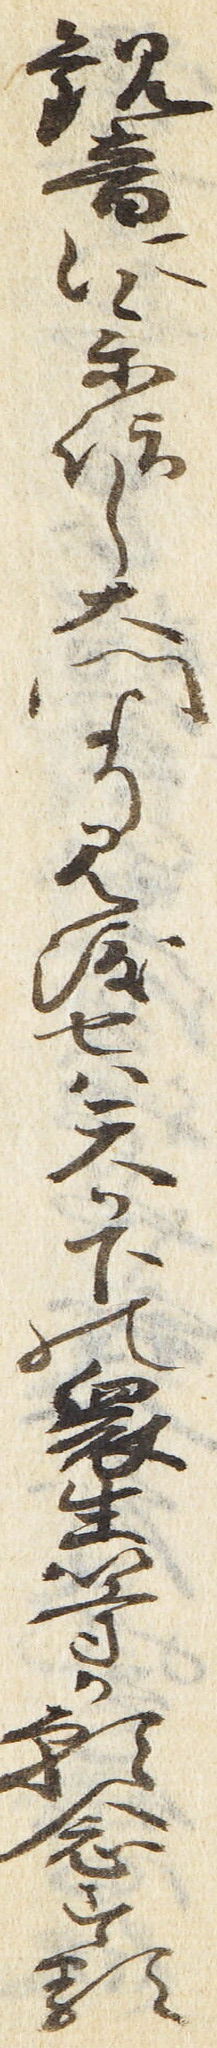観音に参詣し大門より見渡せは天か下の衆生等か願念する
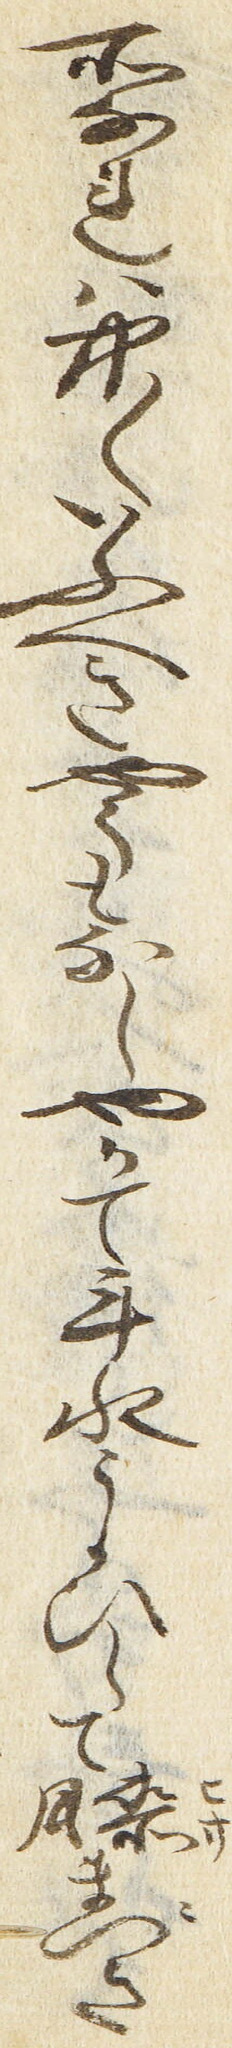所なれは中〳〵いふへきやうもなしやかて手水うかひして膝まづき
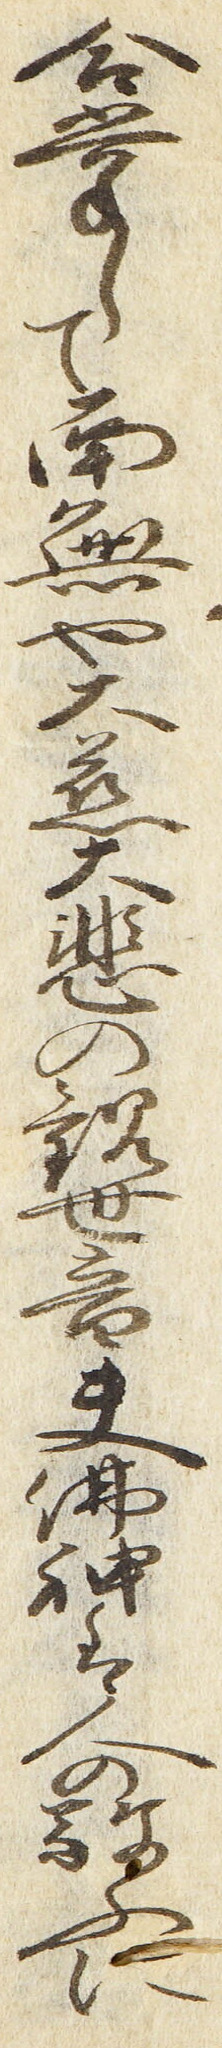合掌して南無や大慈大悲の観世音夫仏神は人の敬ふに

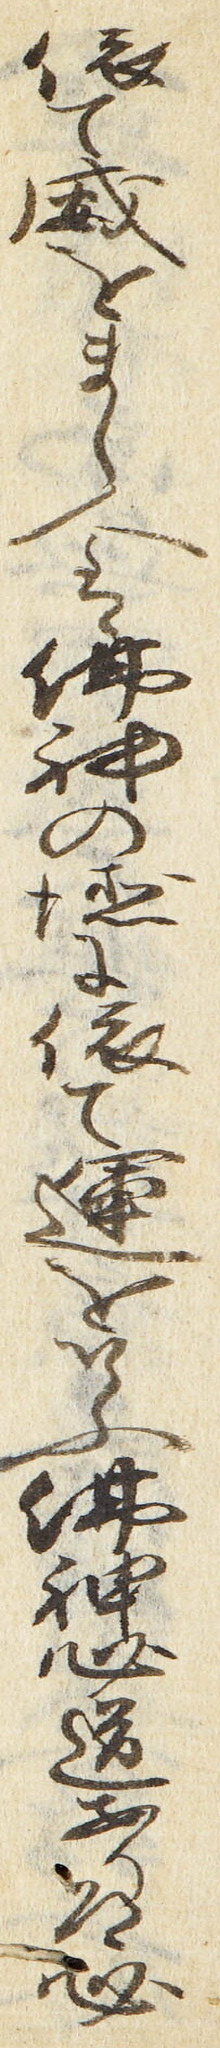依て威をまし人は仏神の徳に依て運をそふ仏神必道あり道必
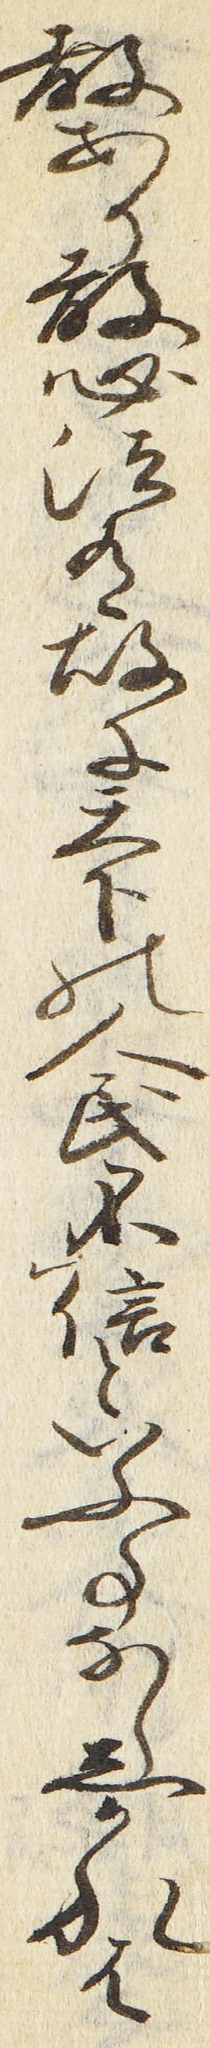教あり教必法有故に天下の人民不信といふ事なししかれは
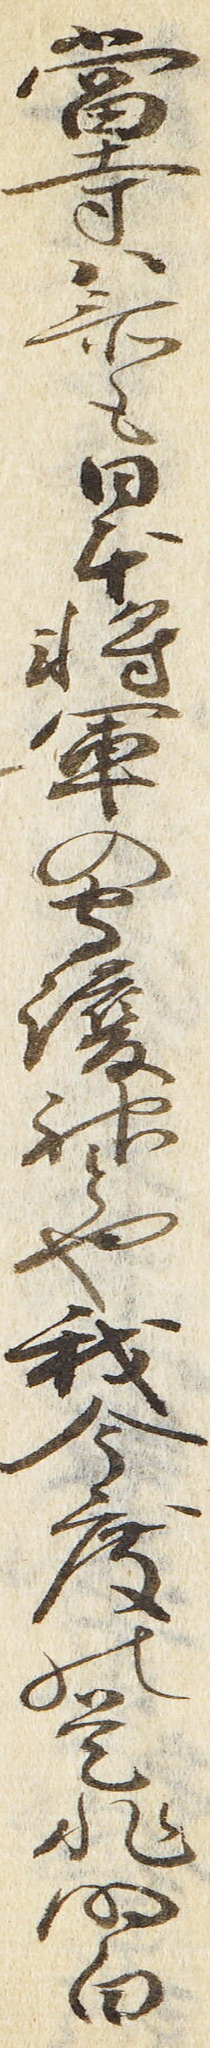当寺は忝も日本将軍の守護神とや我今度の是非明白
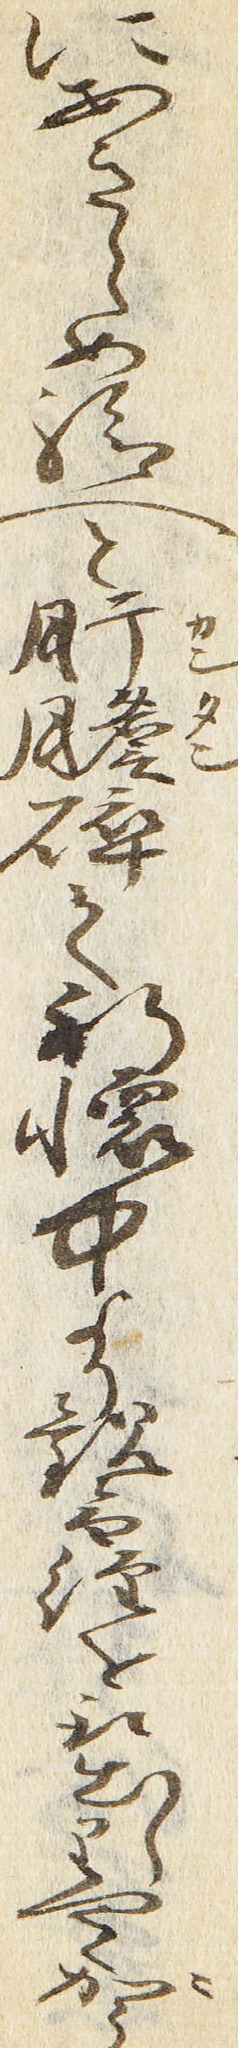にあきらめ給へと肝胆碎て祈懐中より観音経を取出しりやくがう
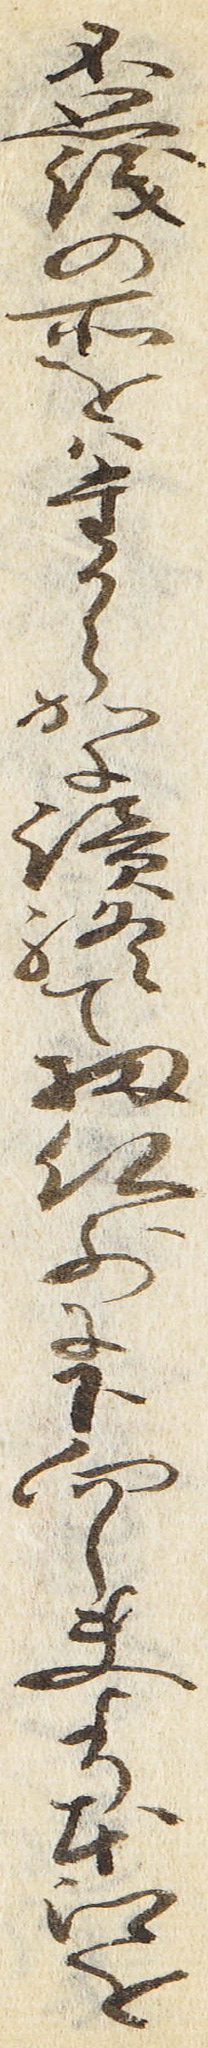不思議の所をはたからかに読終て扨仏前に下向し夫より本郷を
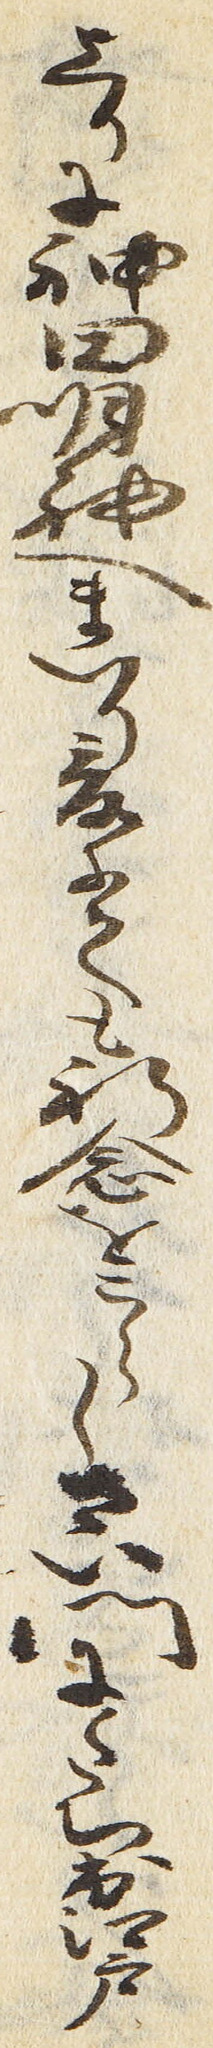上りに神田明神へまいり爰にても祈念をこらしさい門にたち出江戸
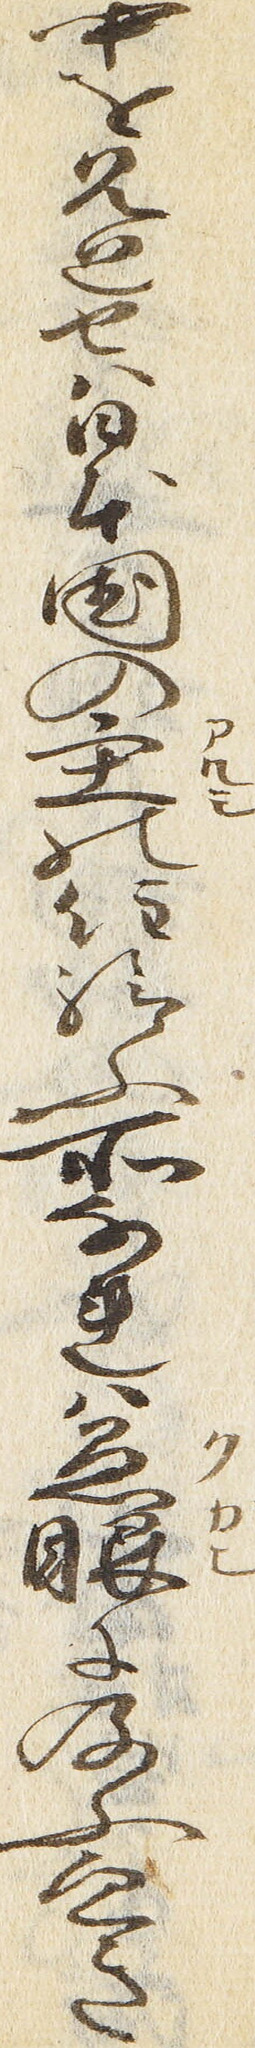中を見廻せは日本国の主の住給ふ所なれは愚眼に及ふへき
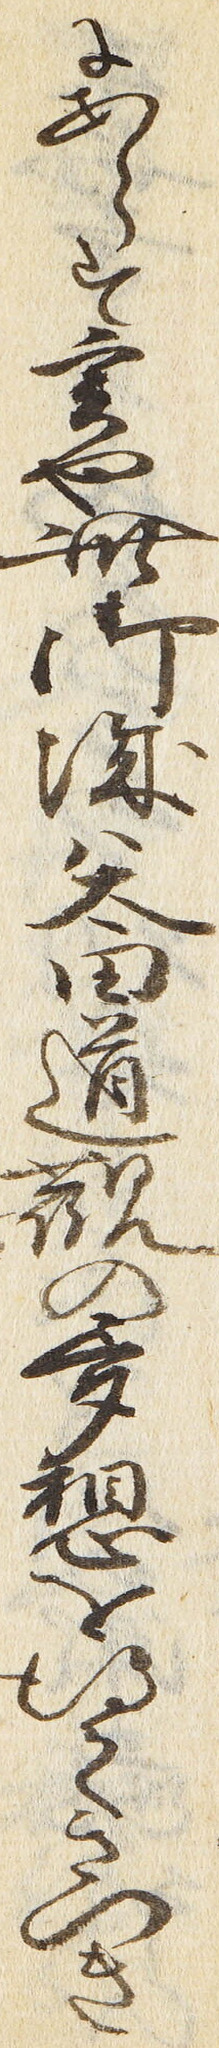にあらす実や此御城は太田道観の夢想を得てきつき
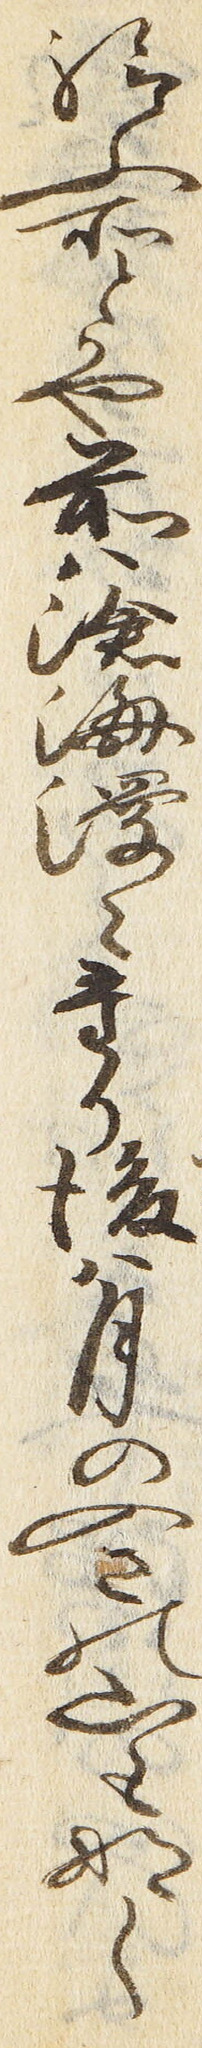給ふ所とかや前は滄海漫々たり後は月の入さの山もなし
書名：海陸世話日記
